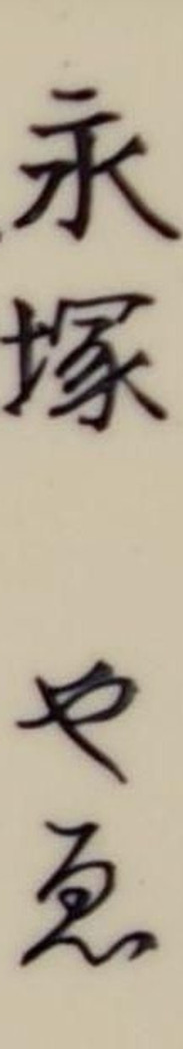永塚やゑ
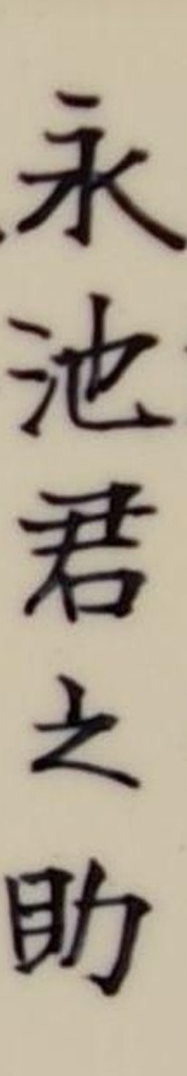永池君之助
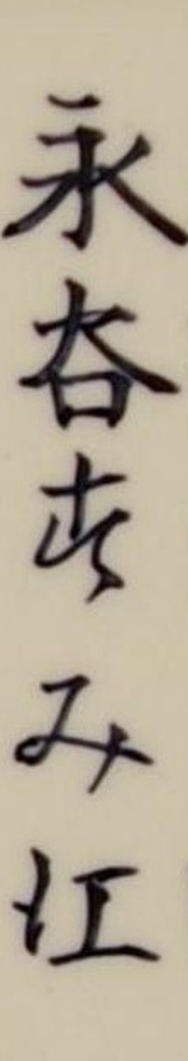永谷すみ江
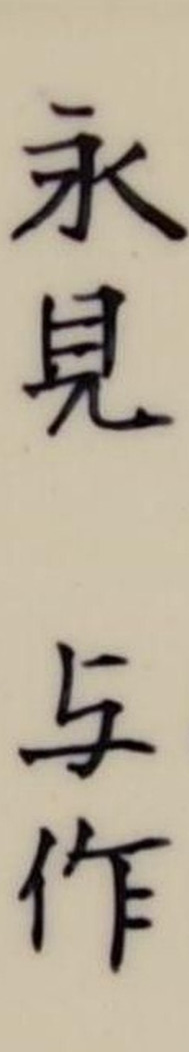永見与作
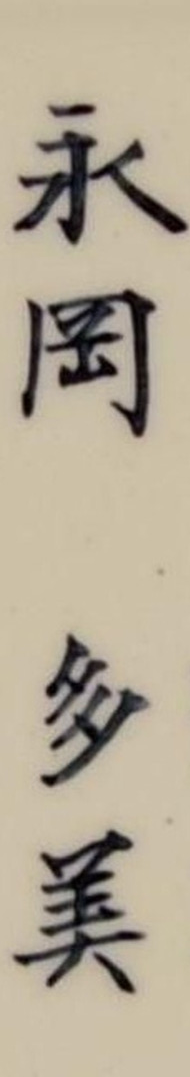永岡多美
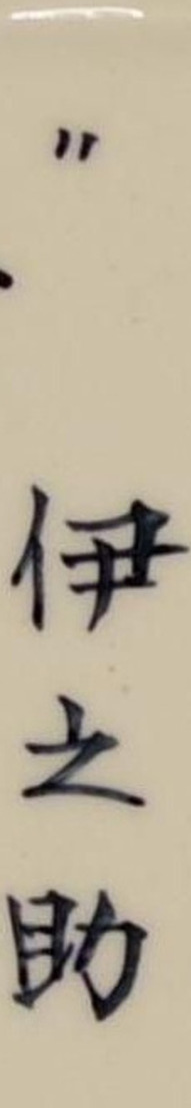伊之助
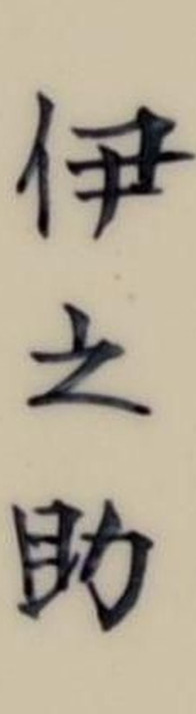伊之助
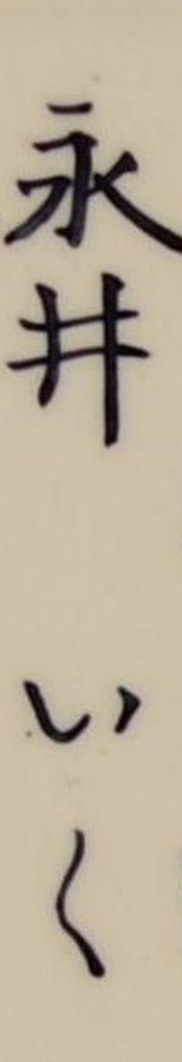永井いく
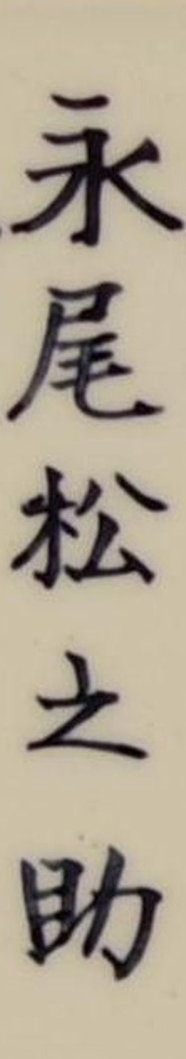永尾松之助
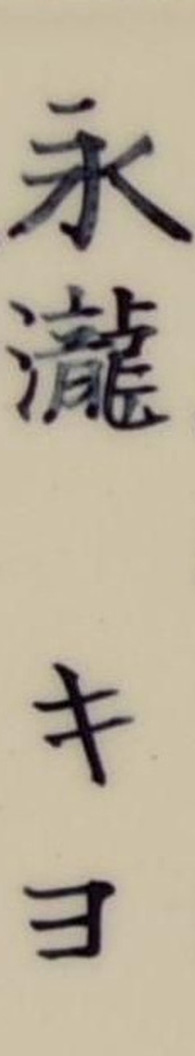永瀧キヨ
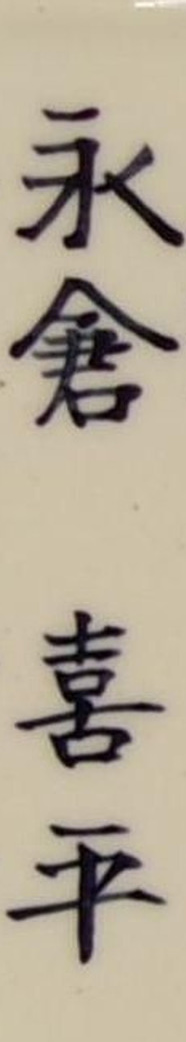永倉喜平
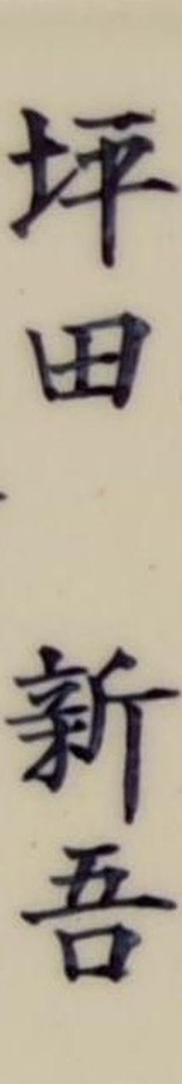坪田新吾
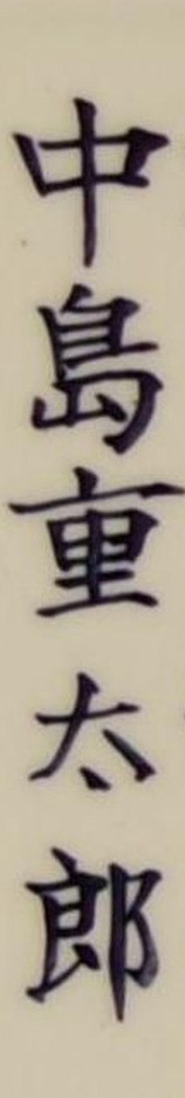中島重太郎
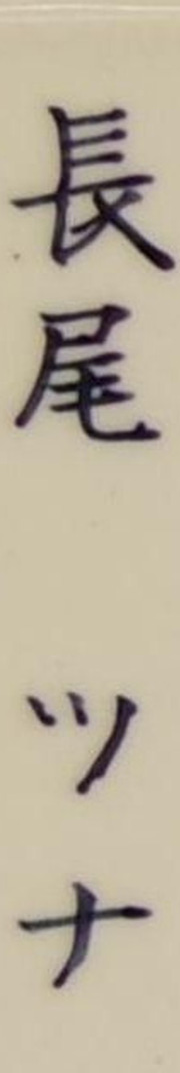長尾ツナ
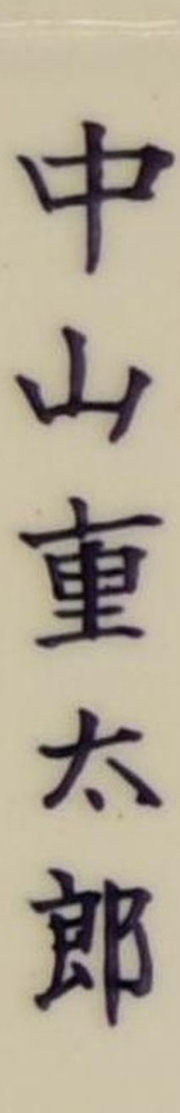中山重太郎

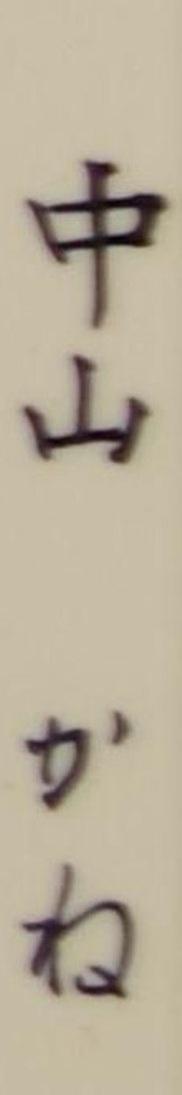中山かね
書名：A~D
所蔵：koyasan kongobuji
